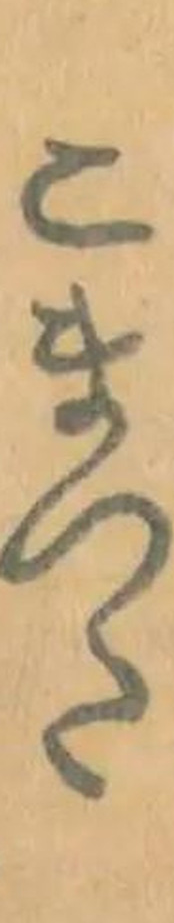こまつた
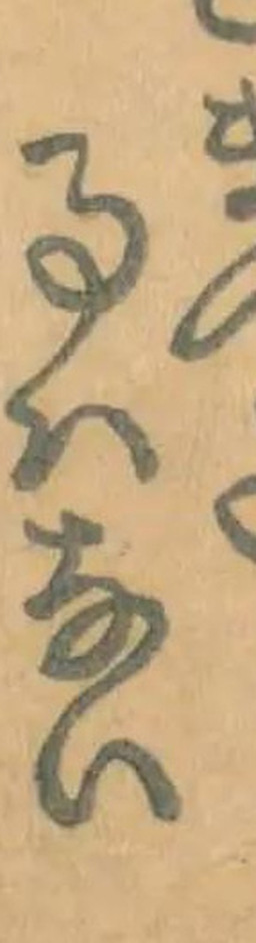事はない
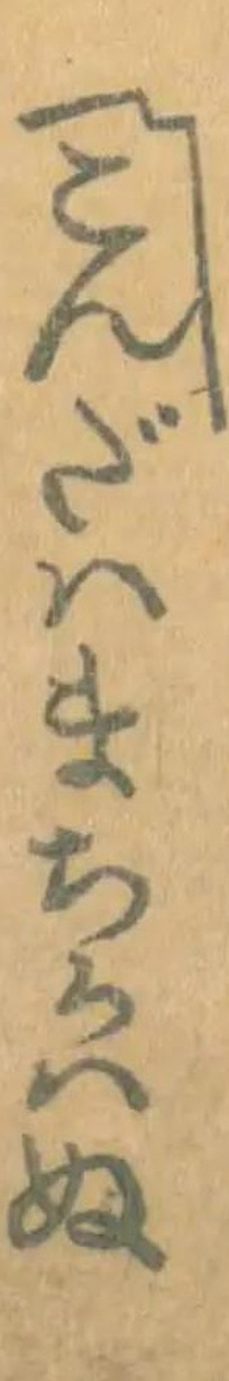〽こんだはまちかはぬ
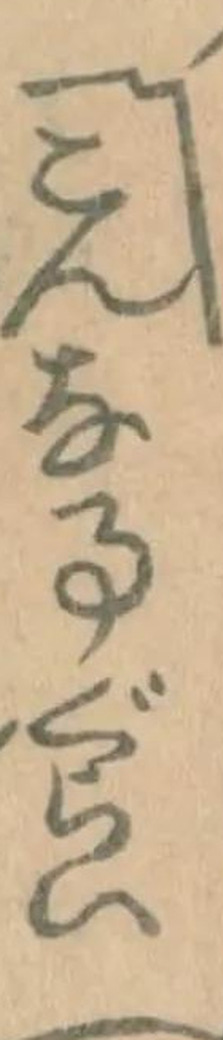〽こんな事ぐらい
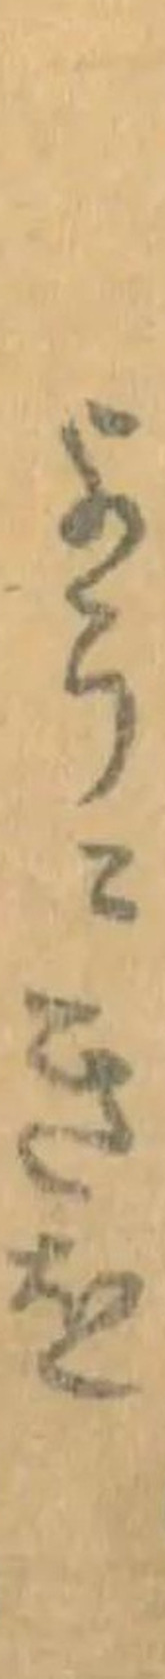ようにきを
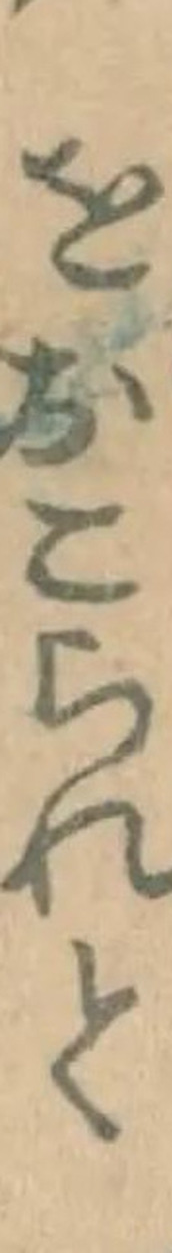をおこられて
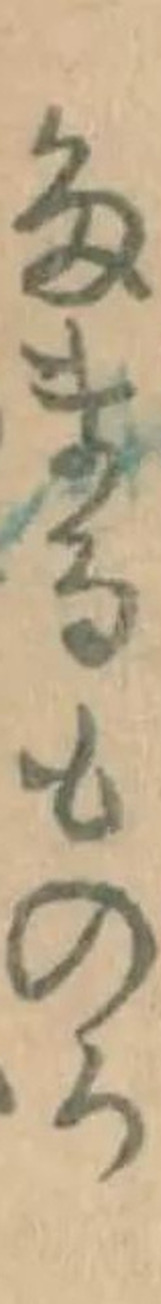たまるものか
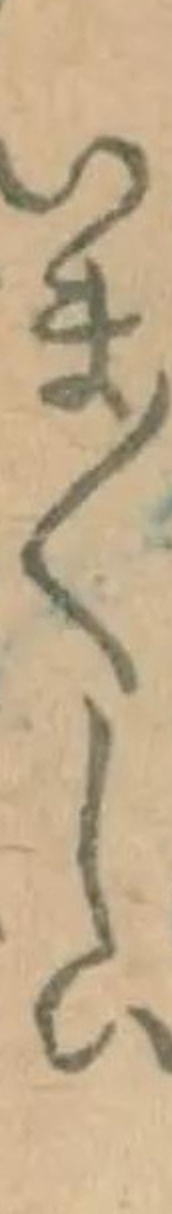いま〳〵しい
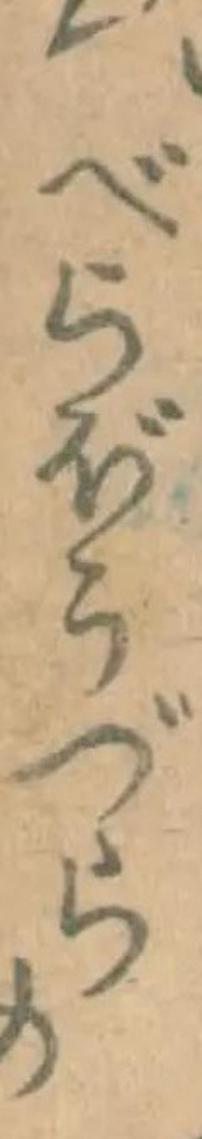べらぼうづらめ

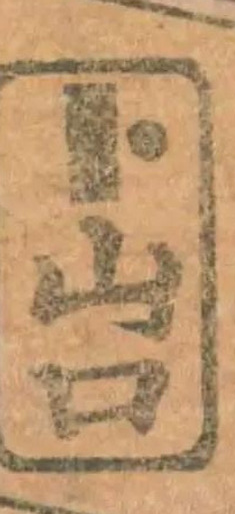ト山口

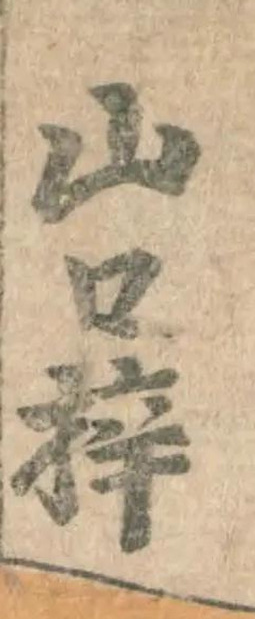山口梓
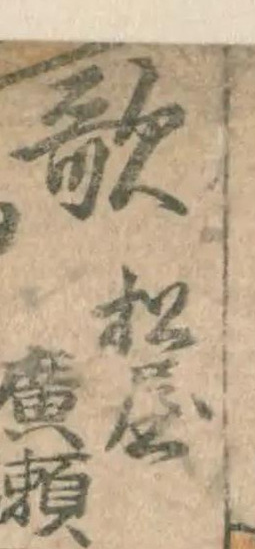歌松屋

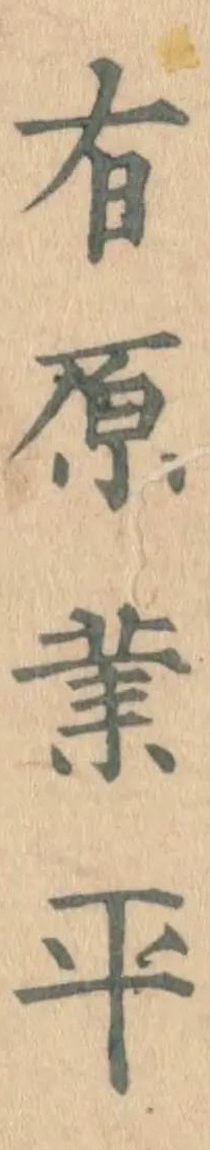有原業平
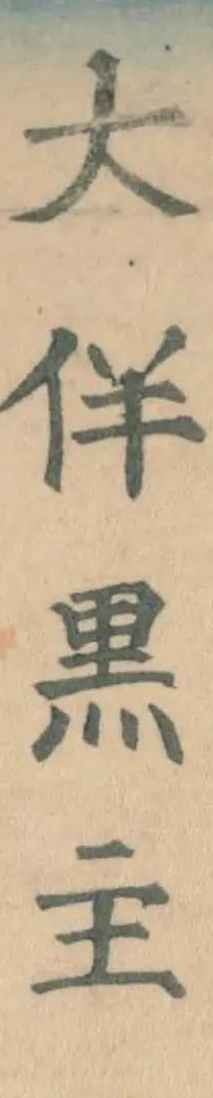大伴黒主
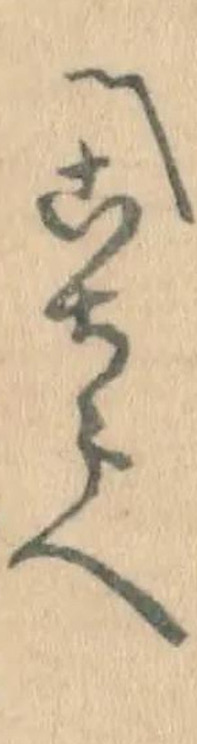〽こちらへ
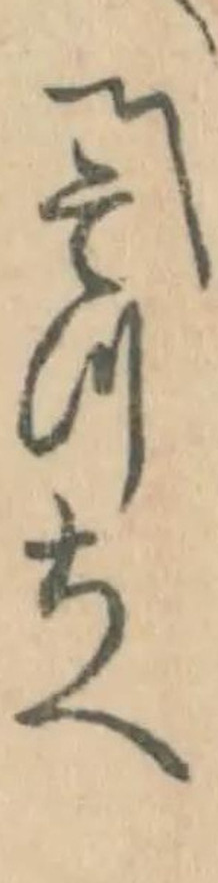〽そつちへ
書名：国芳国貞錦絵
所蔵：国立国会図書館 National Diet Library, JAPAN
